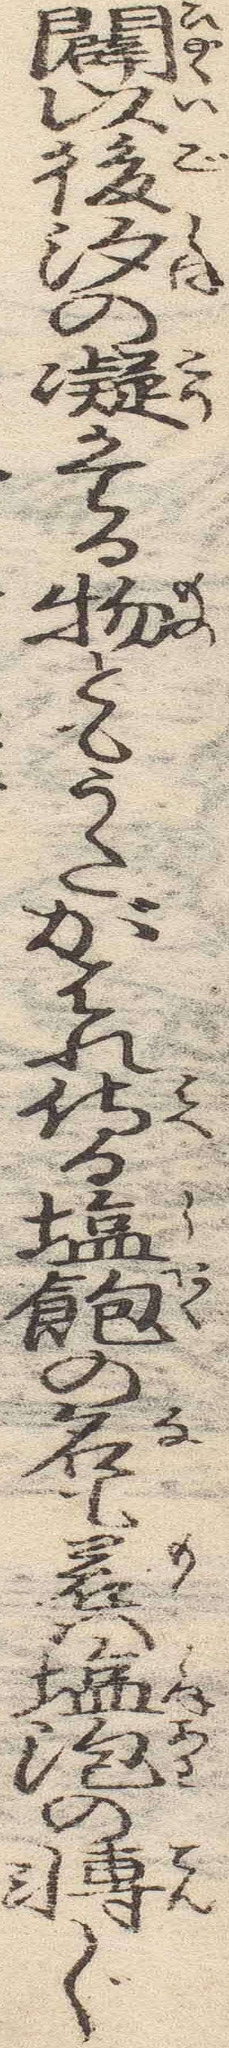闢以後汐の凝たる物ともうたがはれ侍る塩飽の名も若は塩泡の転じ
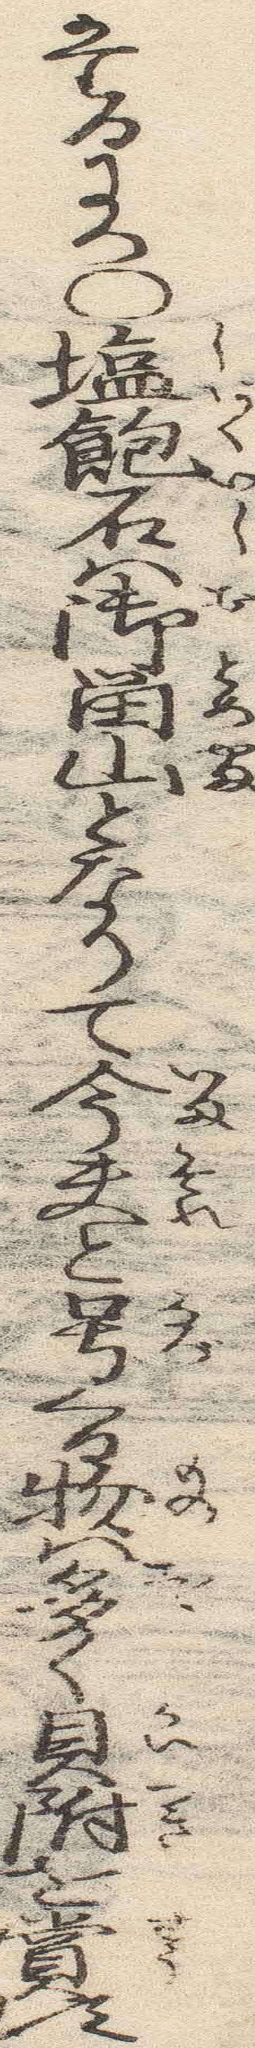たるにか○塩飽石は御留山となりて今夫と号くる物は多く貝附を賞す
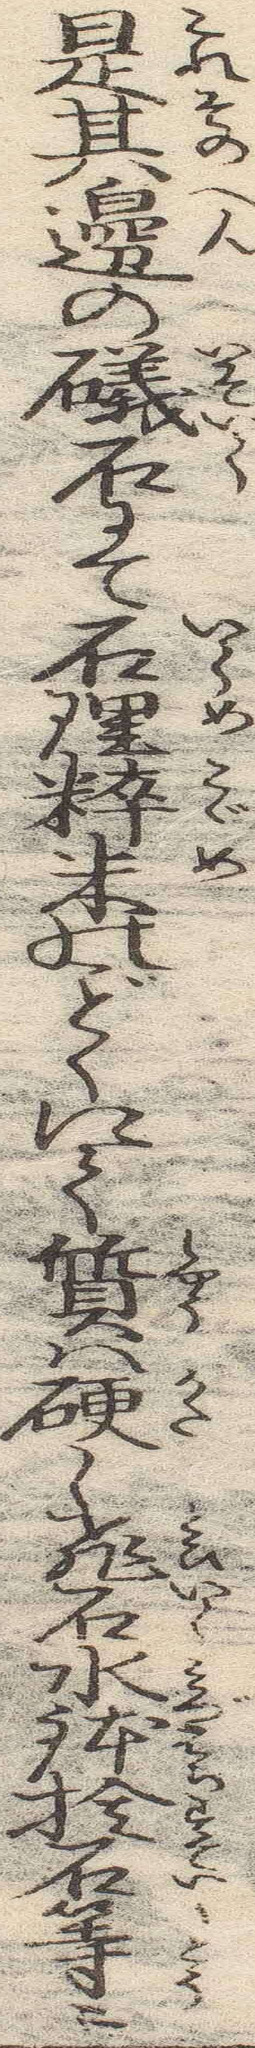是其辺の礒石にて石理粋米のごとくにて質は硬く飛石水鉢捨石等に
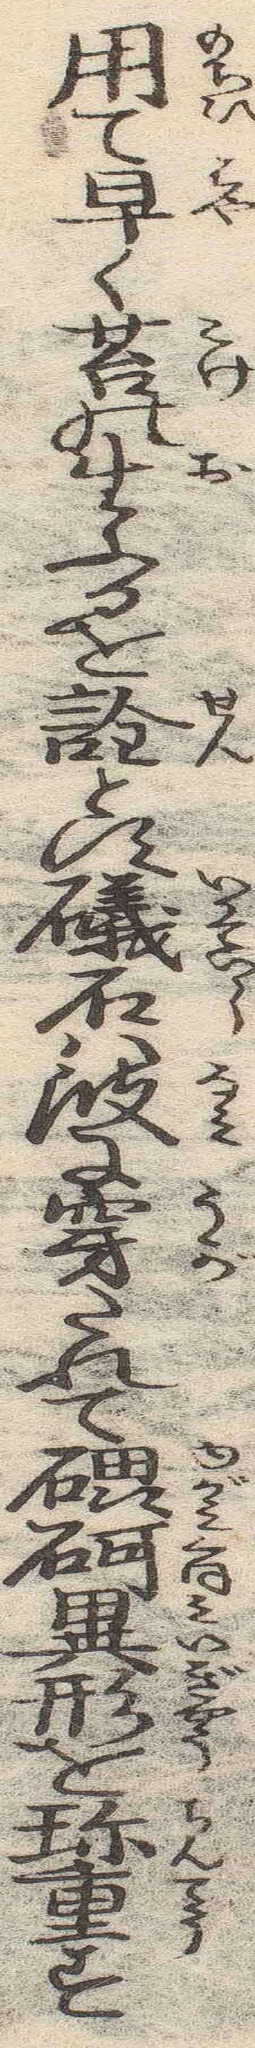用て早く苔の生ふるを詮とす礒石は波に穿たれて礧砢異形を珎重す
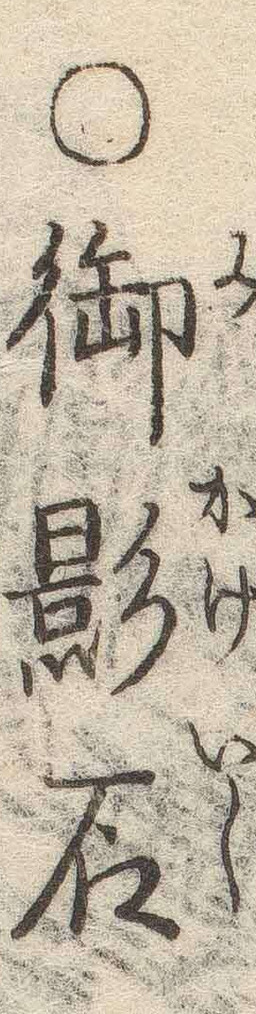○御影石
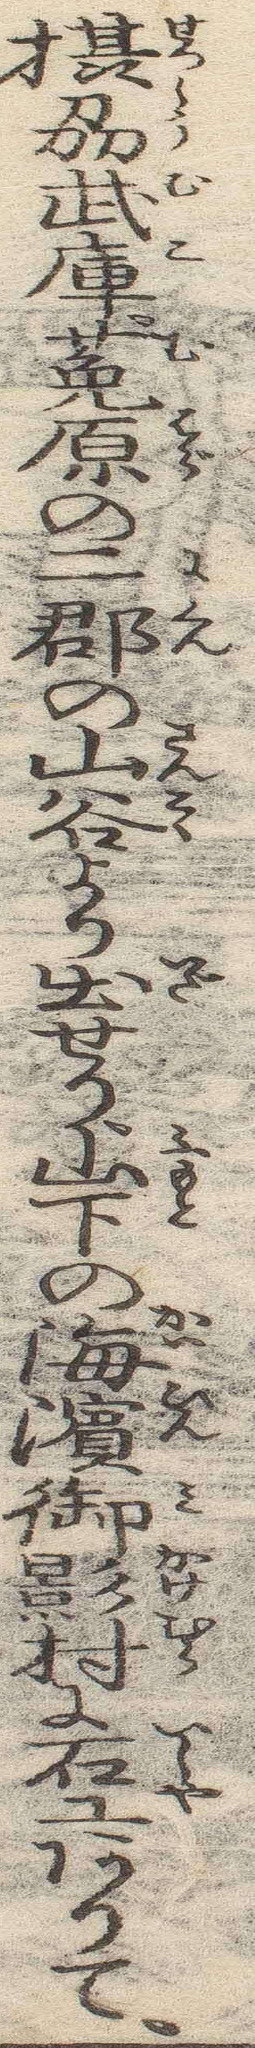摂州武庫。菟原の二郡の山谷より出せり。山下の海浜御影村に石工ありて。
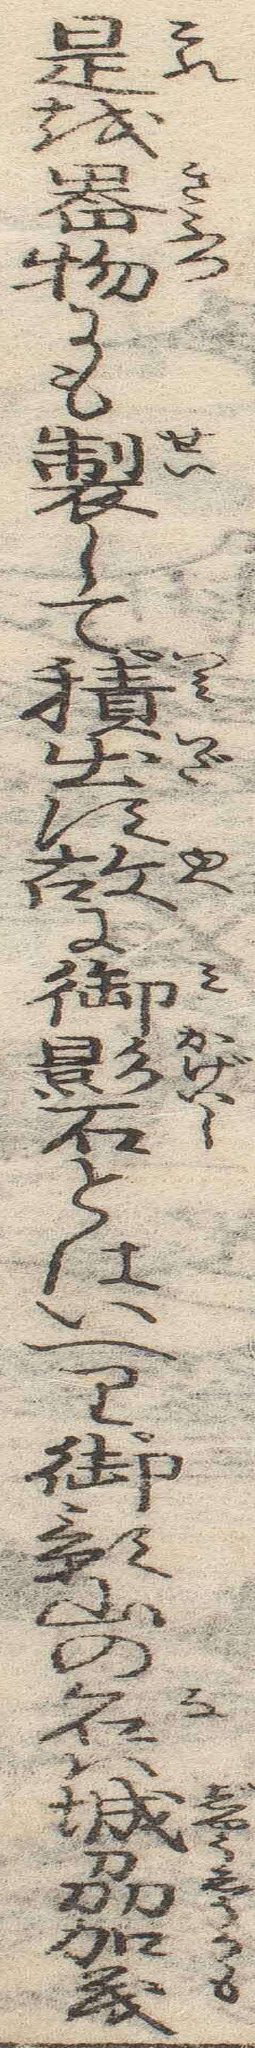是を器物にも製して。積出す故に御影石とはいへり。御影山の名は城州加茂
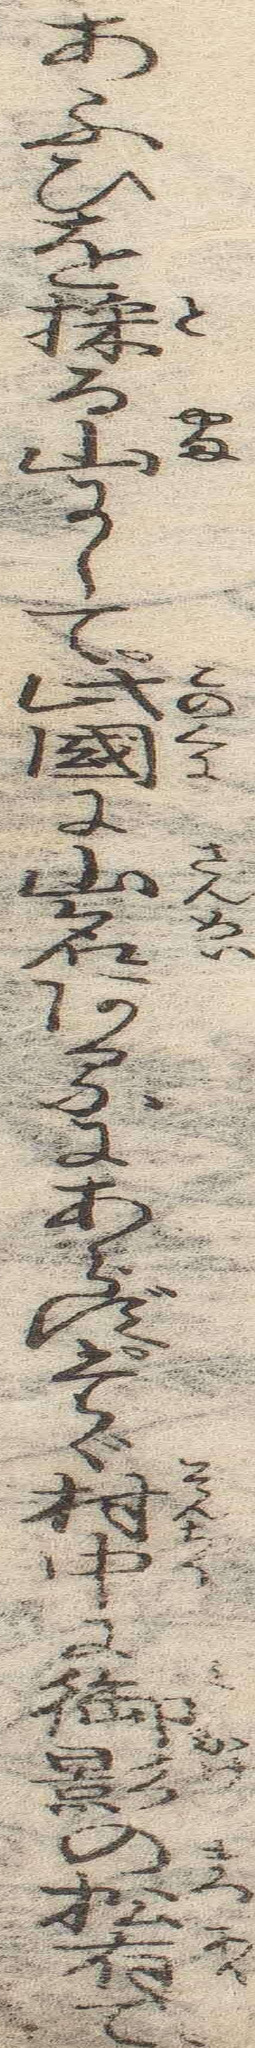あふひ採る山にして。此国に山名あるにあらず。たゞ村中に御影の松有て
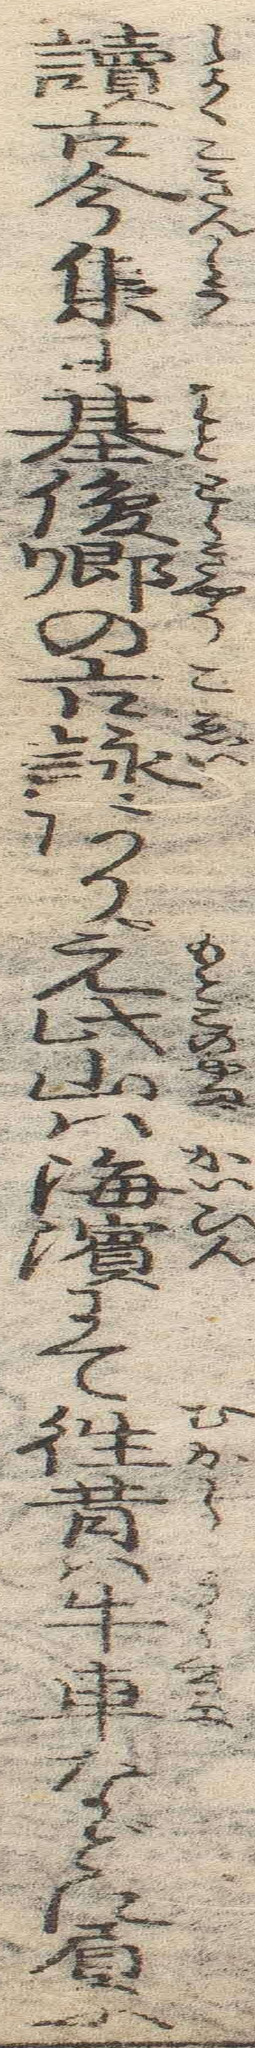読古今集に基俊卿の古詠あり。元此山は海浜にて往昔は牛車などに負ふ
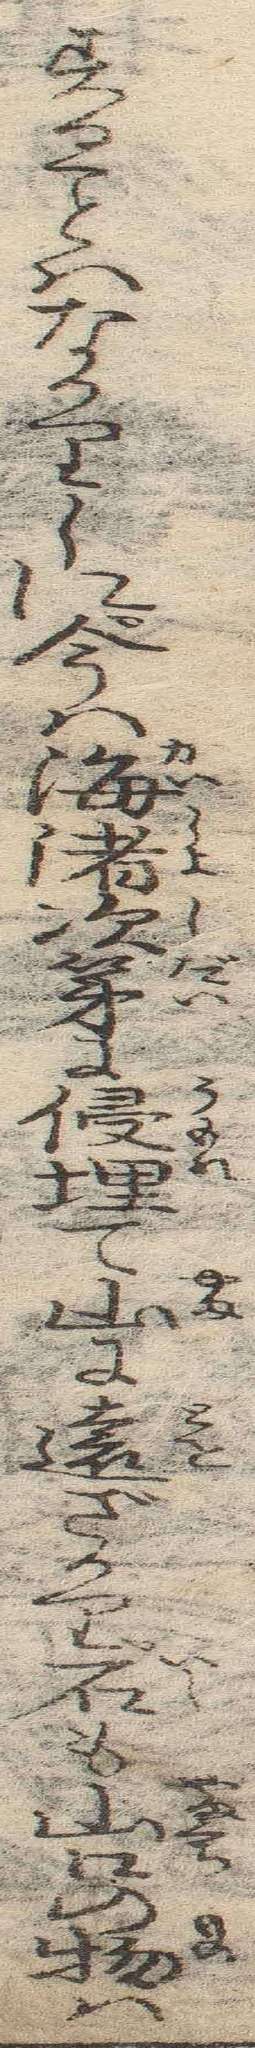することはなかりしに。今は海渚次第に侵埋て山に遠ざかり。石も山口の物は
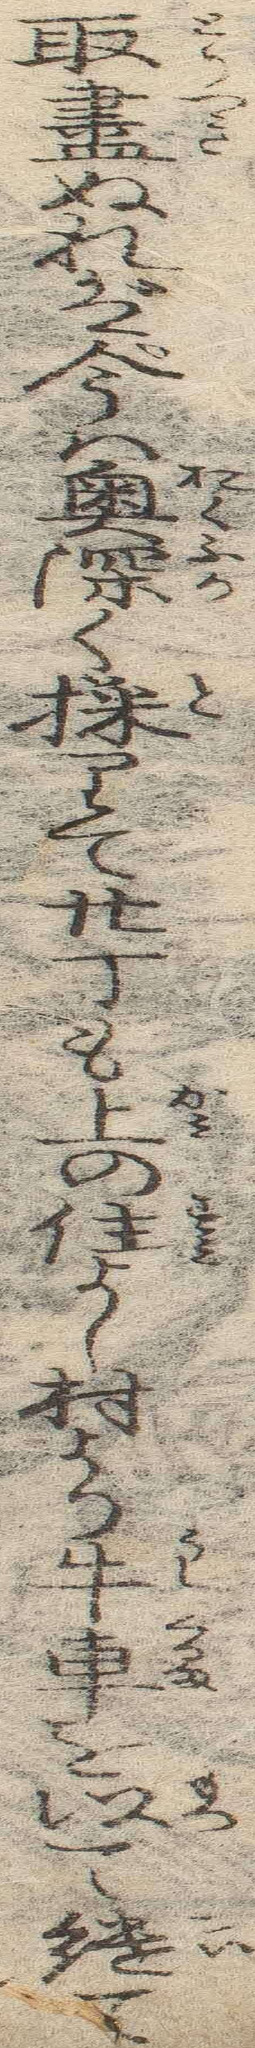取尽ぬれば。今は奥深く採りて廿丁も上の住よし村より牛車を以て継て
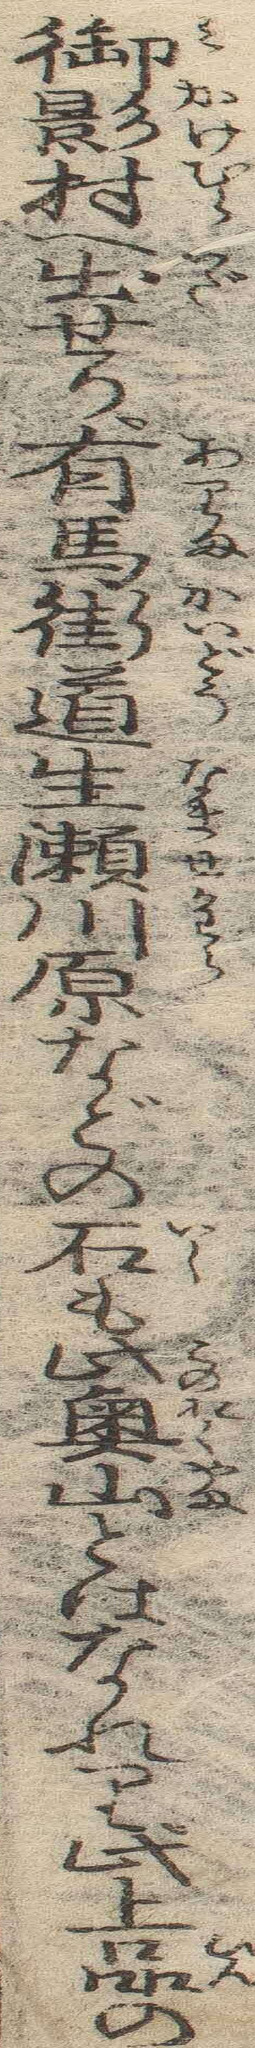御影村へ出せり。有馬街道生瀬川原などの石も此奥山とはなれり。此上品の

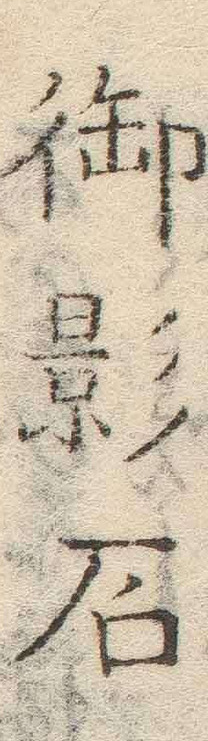御影石

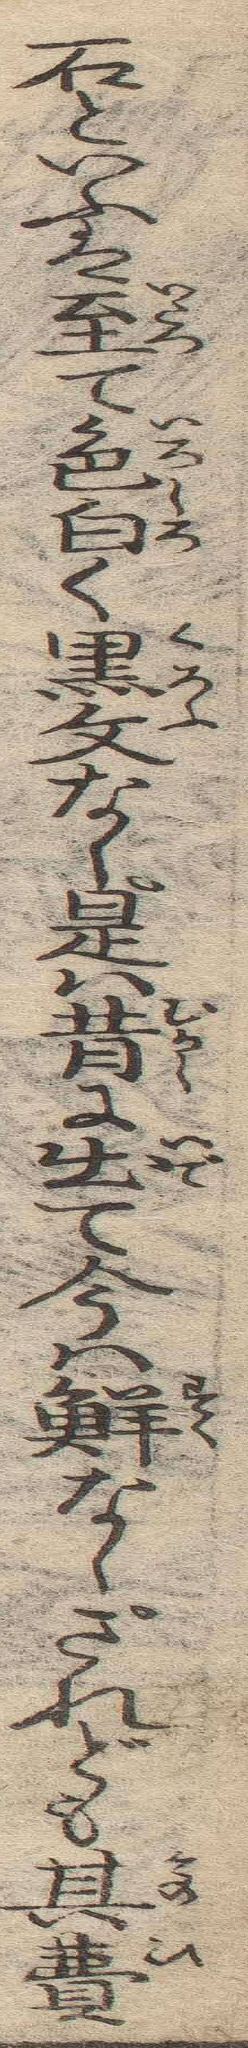石といふは至て色白く黒文なし。是は昔に出て今は鮮なし。されども其費
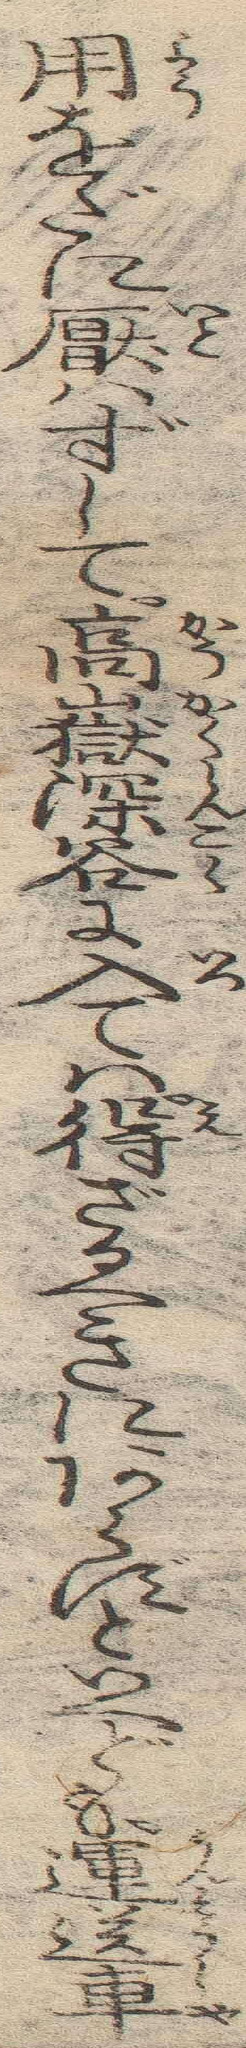用をだに厭はずして。高嶽深谷に入ては。得ざるへきにあらずといへども。運送車
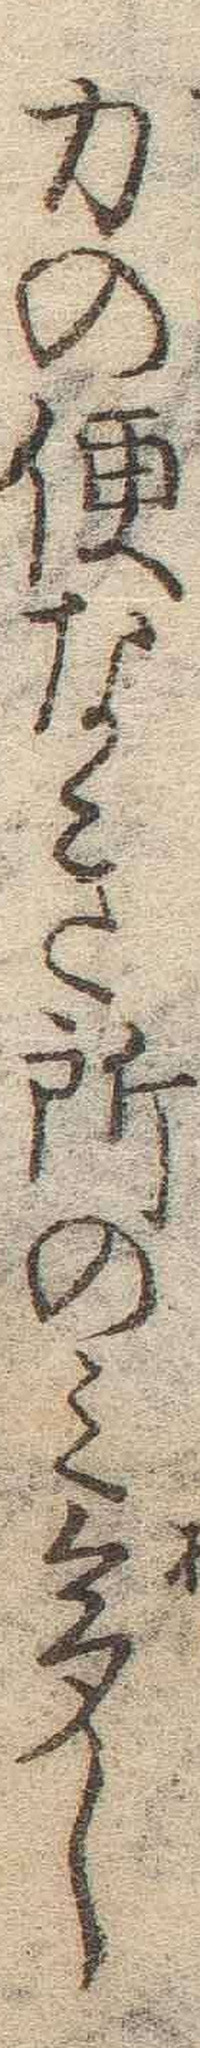力の便なき所のみ多し
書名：日本山海名産図会
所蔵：東京学芸大学附属図書館 国文学研究資料館
